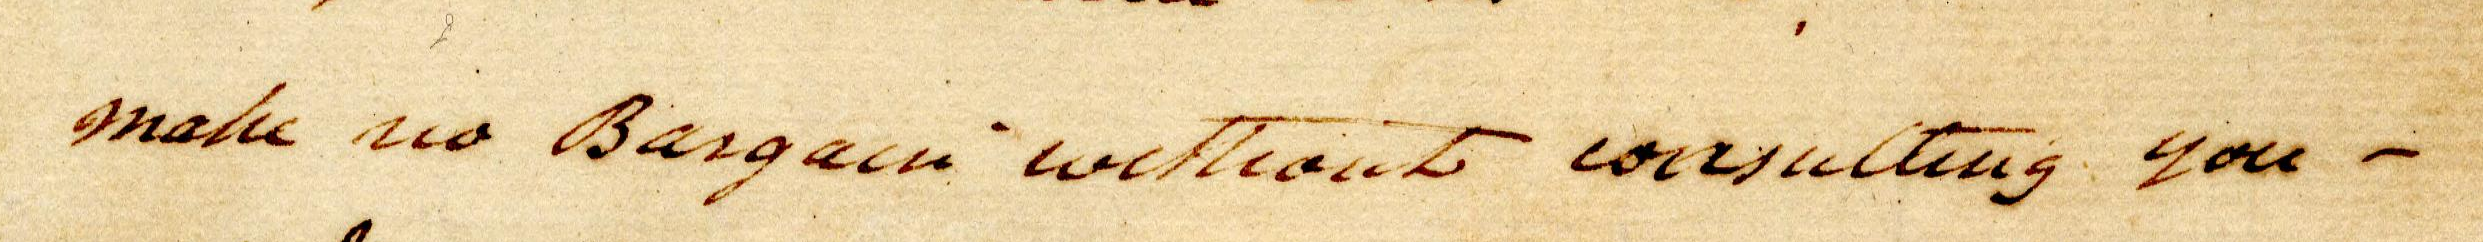make no Bargain without consulting you
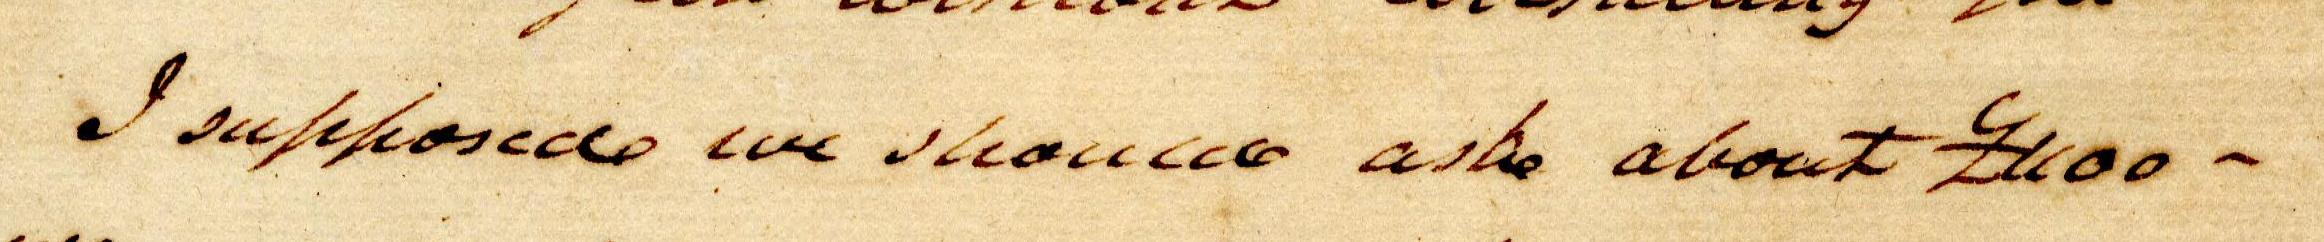I supposed we should ask about £1100
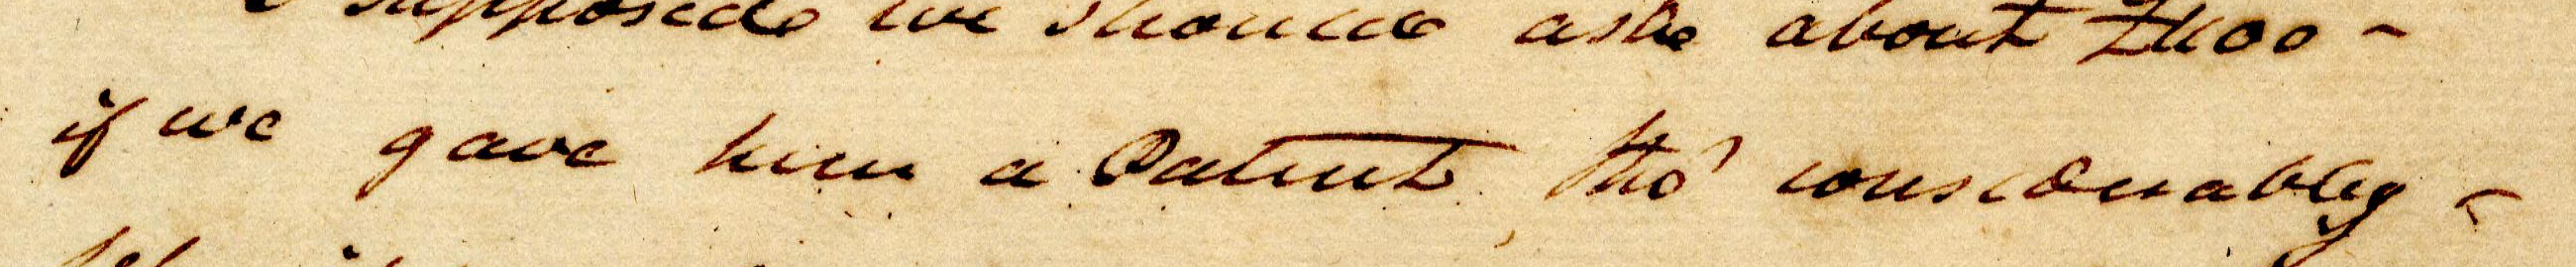if we gave him a Patient tho' considerably
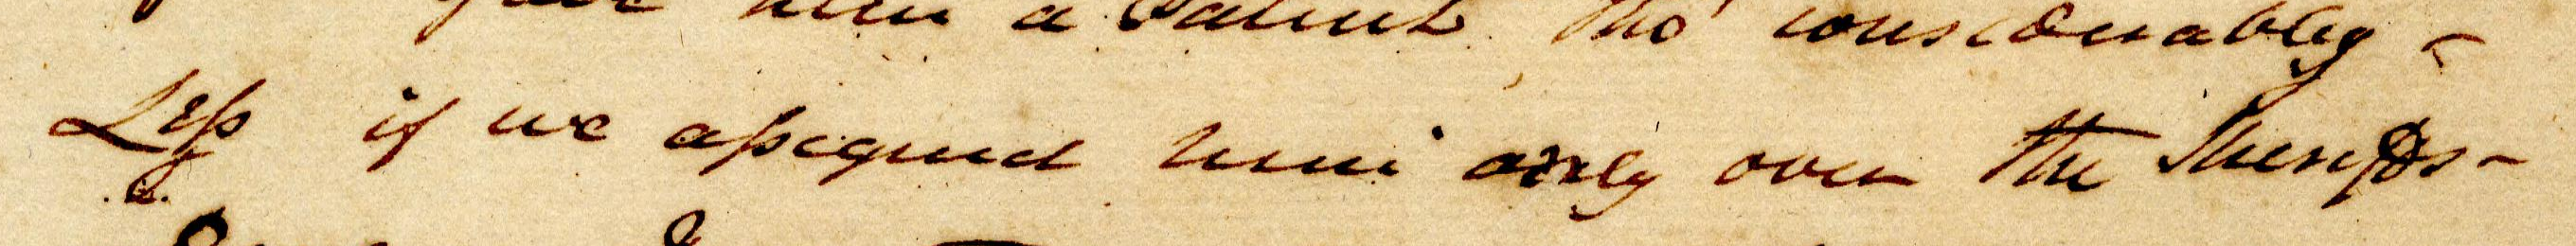Less if we assiqned him only over the Sherefds-
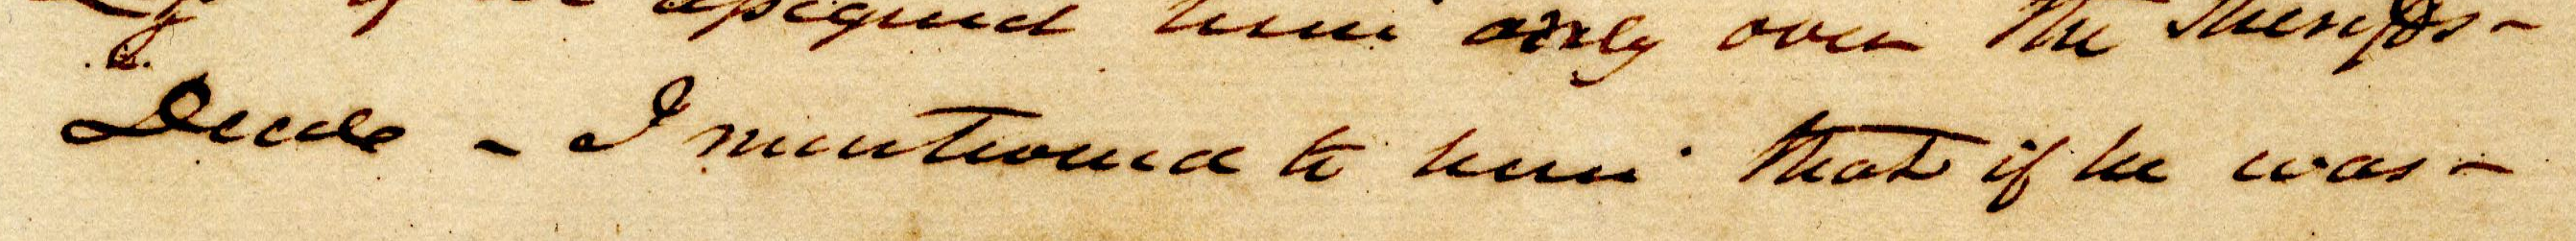Deed. I mentioned to him that if he was
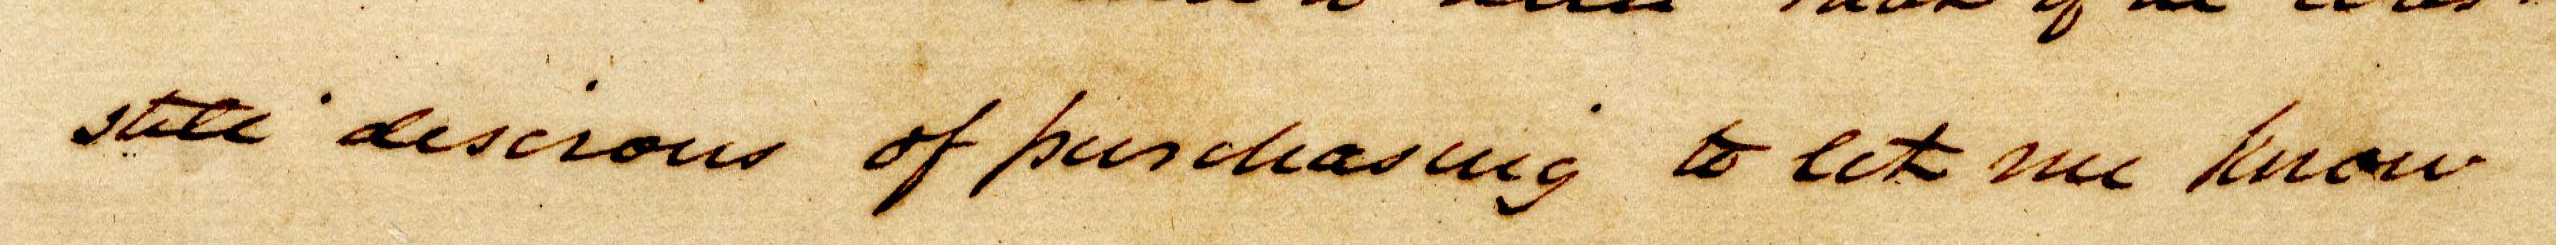still desirous of purchasing to let me know
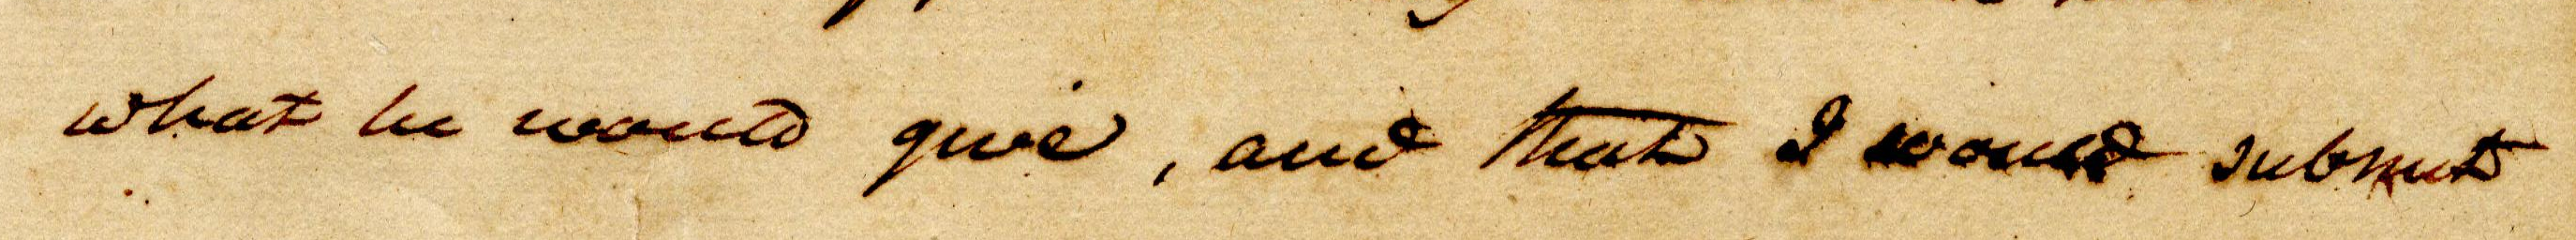what he would give, and that I would submit
